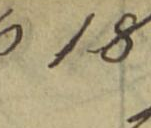p 18
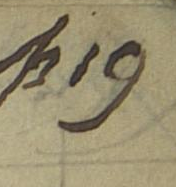p 19
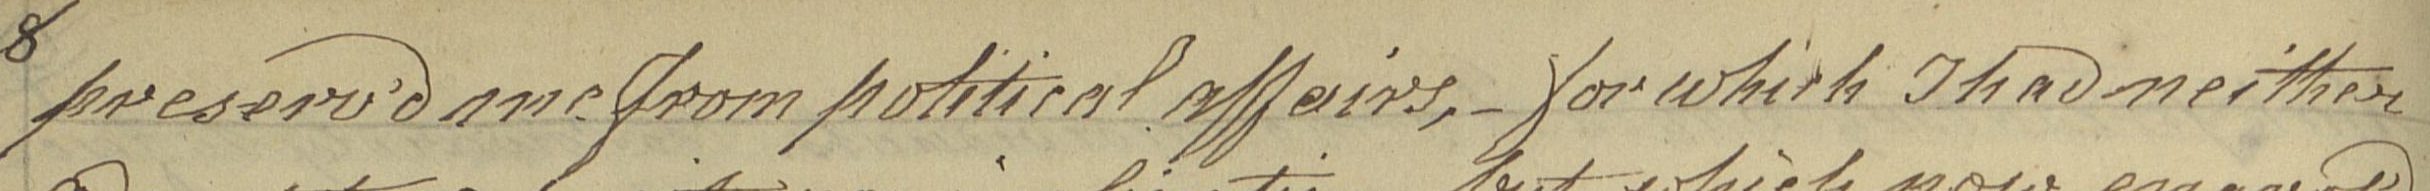preserv'd me from political affairs, for which I had neither
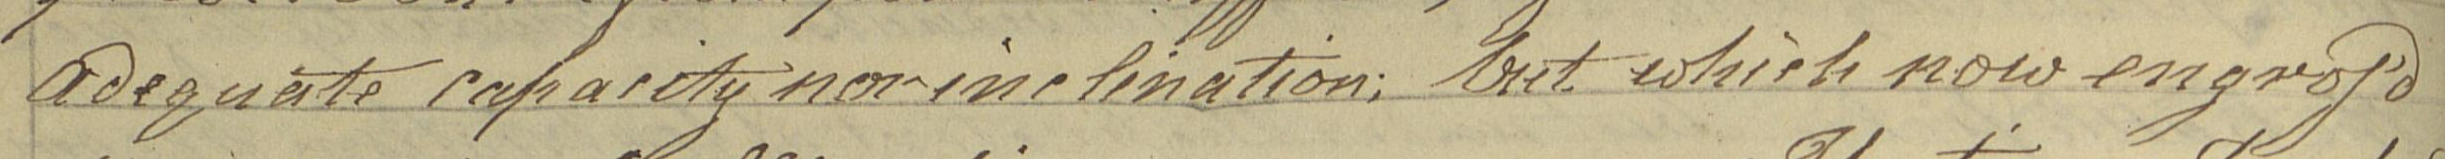Adequate capacity nor inclination; but which now engros'd
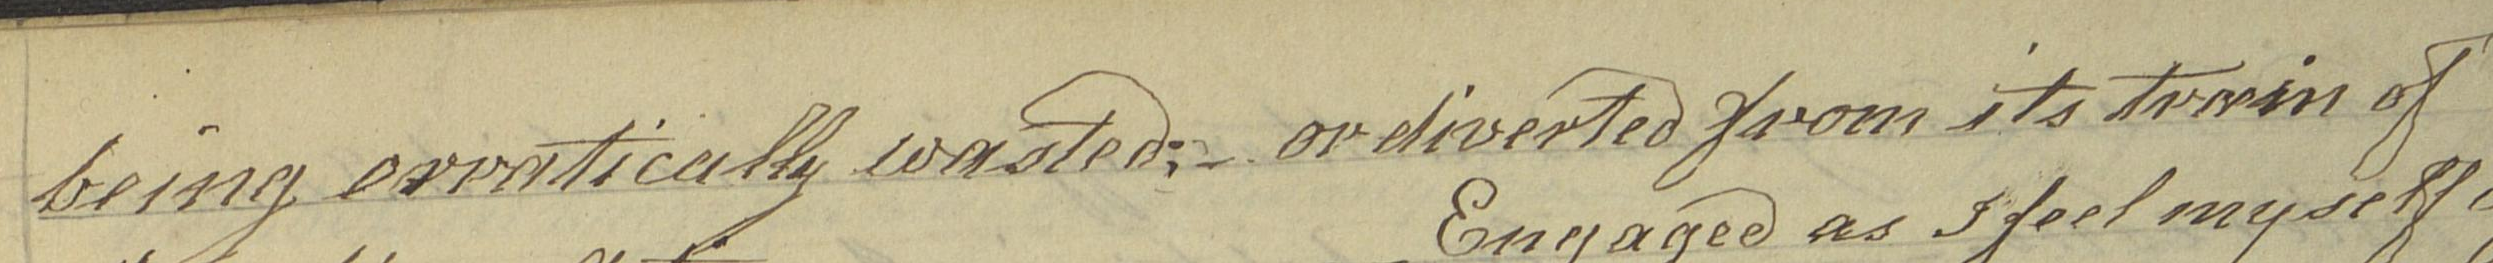being erratically wasted or diverted from its trim of
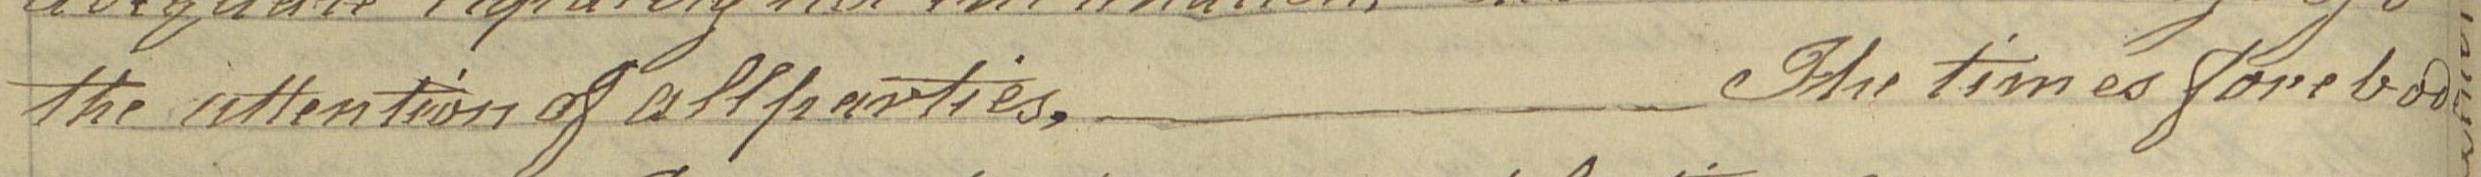the attention of all parties. The times forebod-
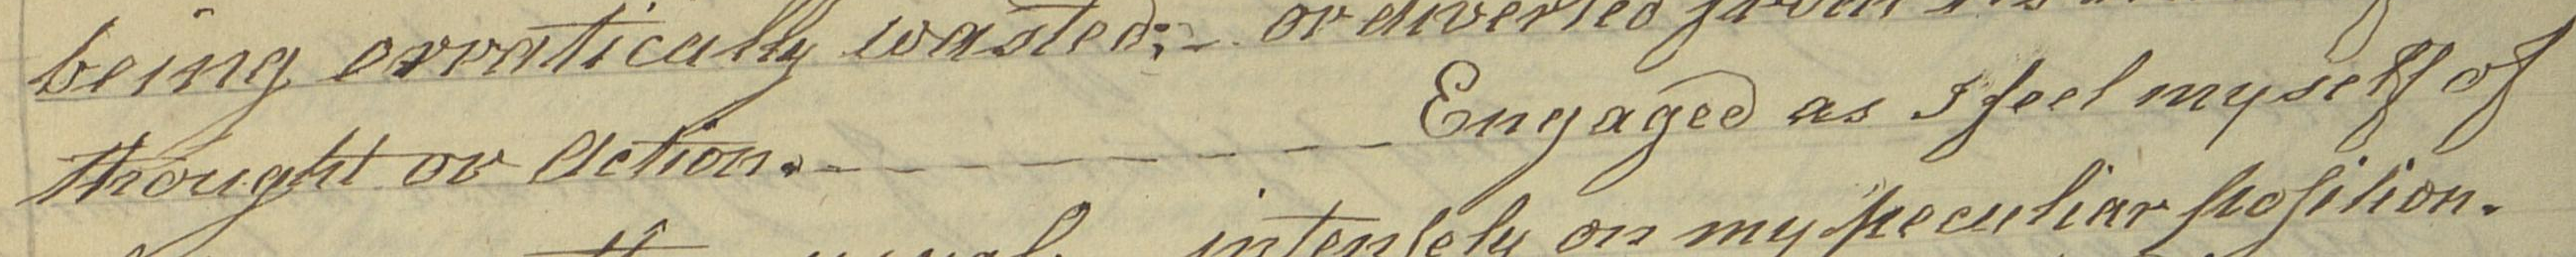thought or Action. Engaged as I feel myself of
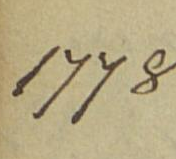1778
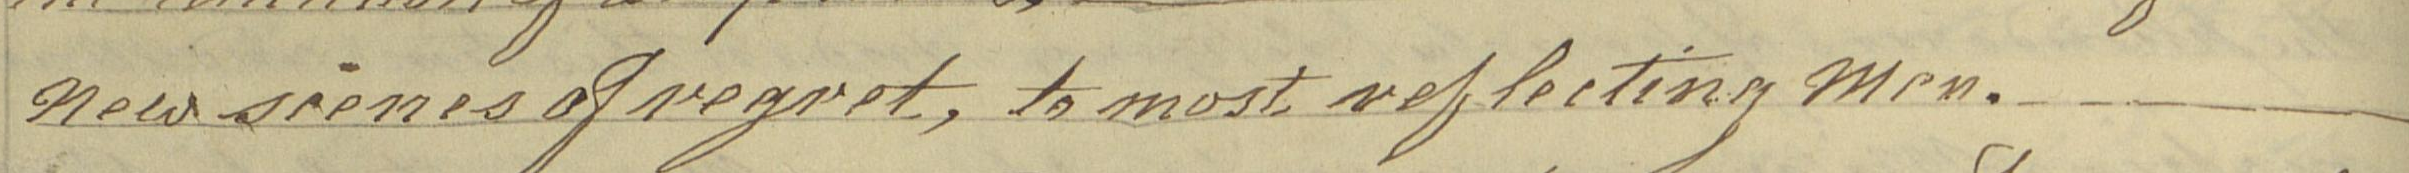new scenes of regret, to most reflecting Men.
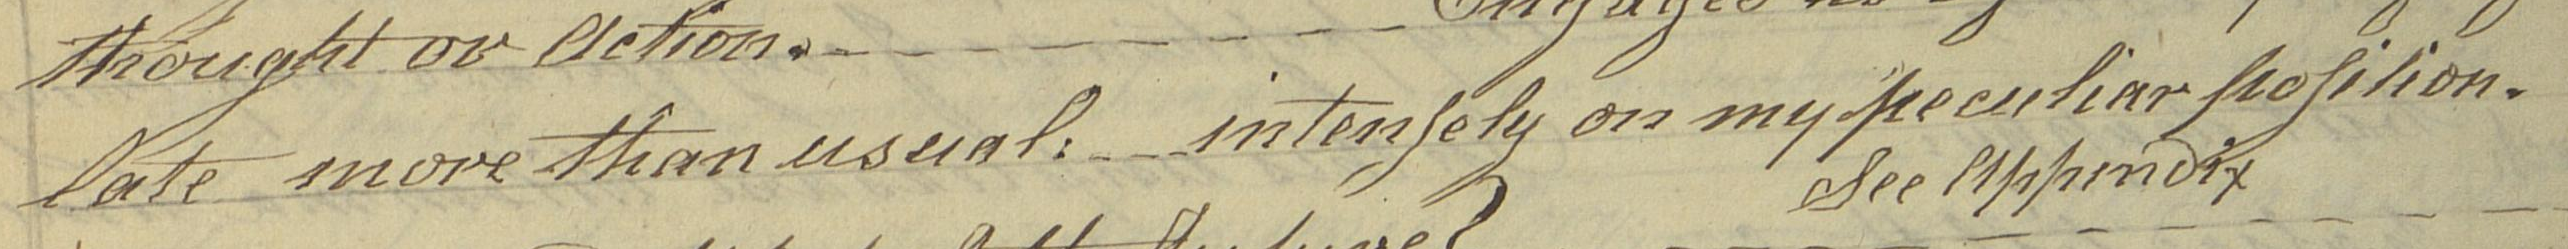late more than usual: intensely on my peculiar position.
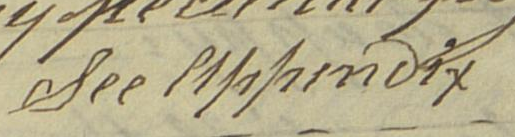See Appendix
